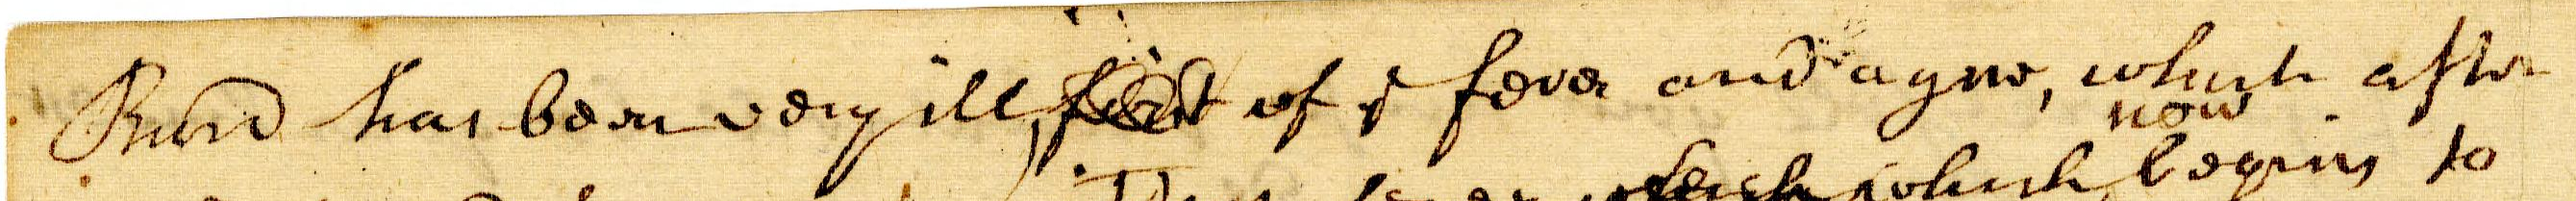Burd has been very ill, [first] of y^e fever and ague, which after
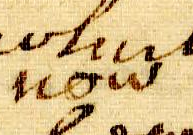now
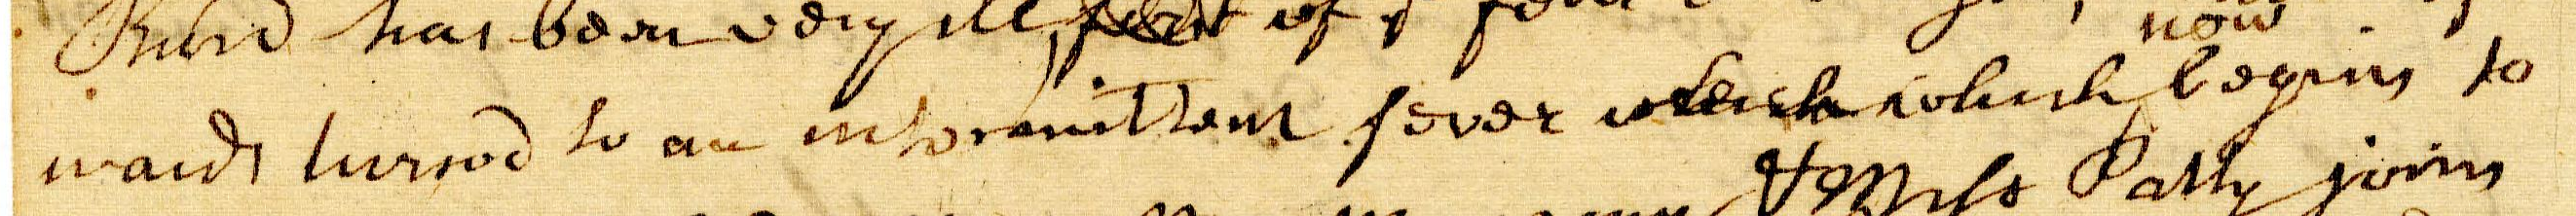wards turned to an intermittent fever [which] whish begins to
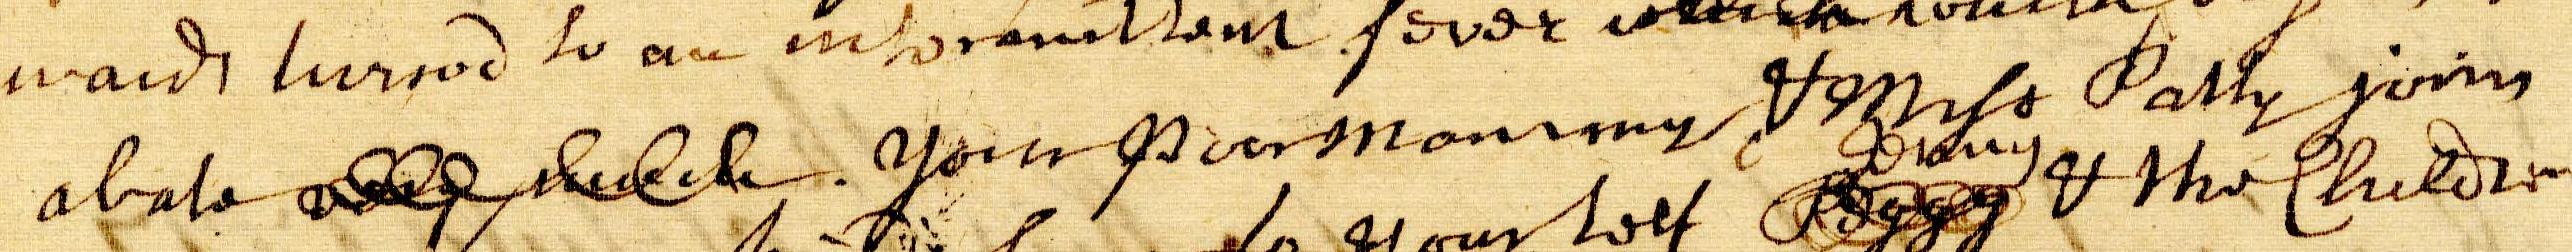abate [_________]. your poor mommy & Miss Patty joins
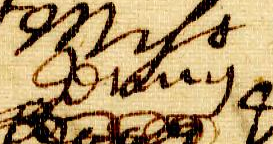Patty
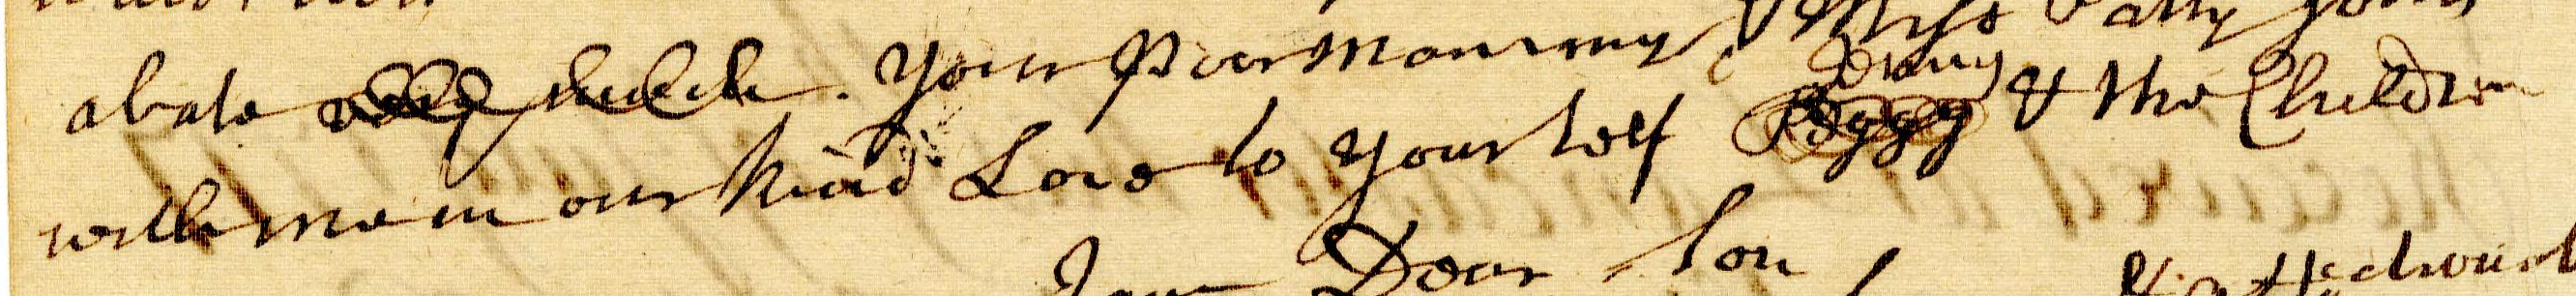with me in our kind Love to your self [Peggy] & the Children
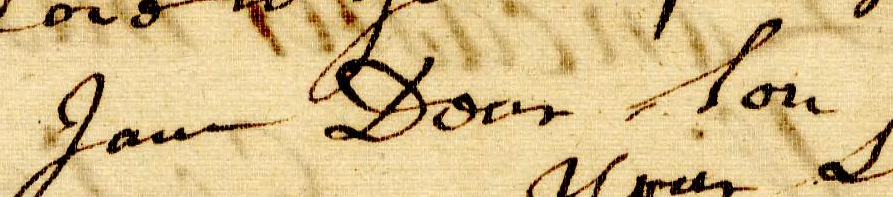Your Dear son
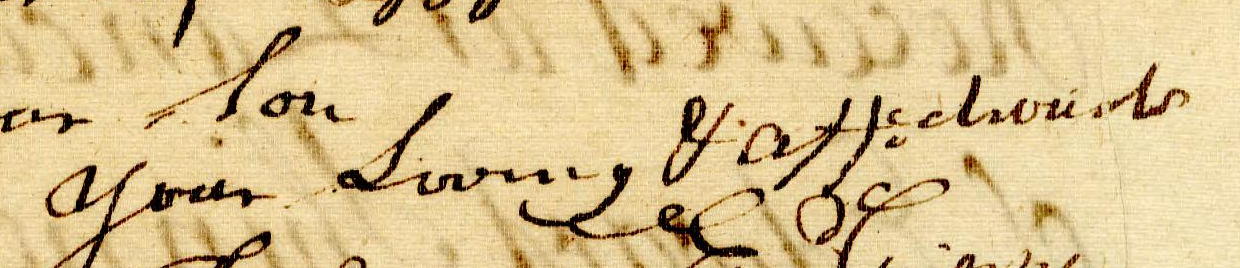your Loving & affectionate
